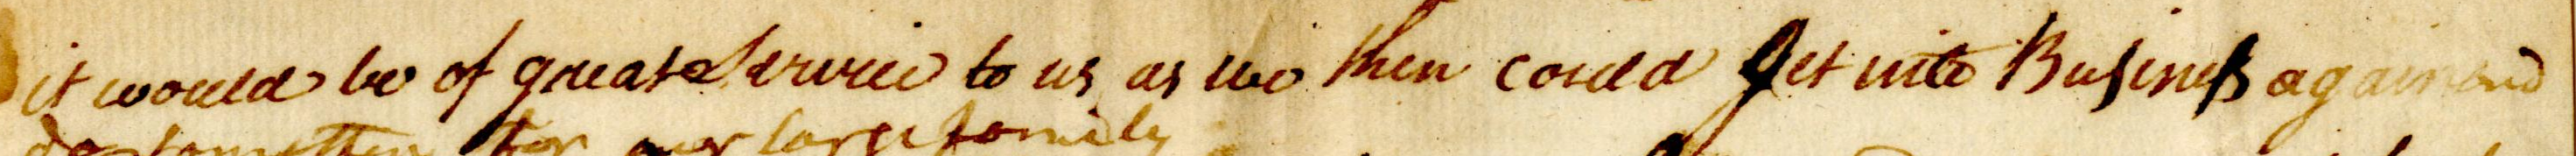it would be of great service to us, as we then could Get into Business again and
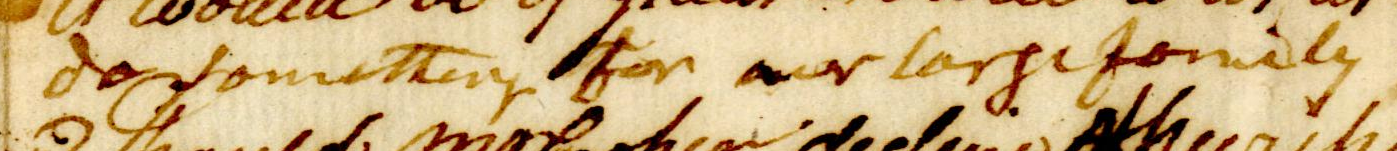do something for our large family
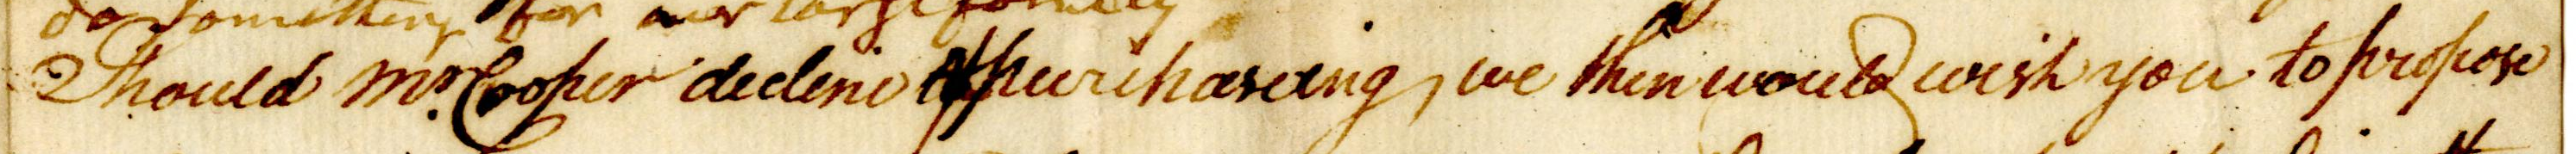should M^r.Cooper decline & [__] purchasing, we then would wish you to propose
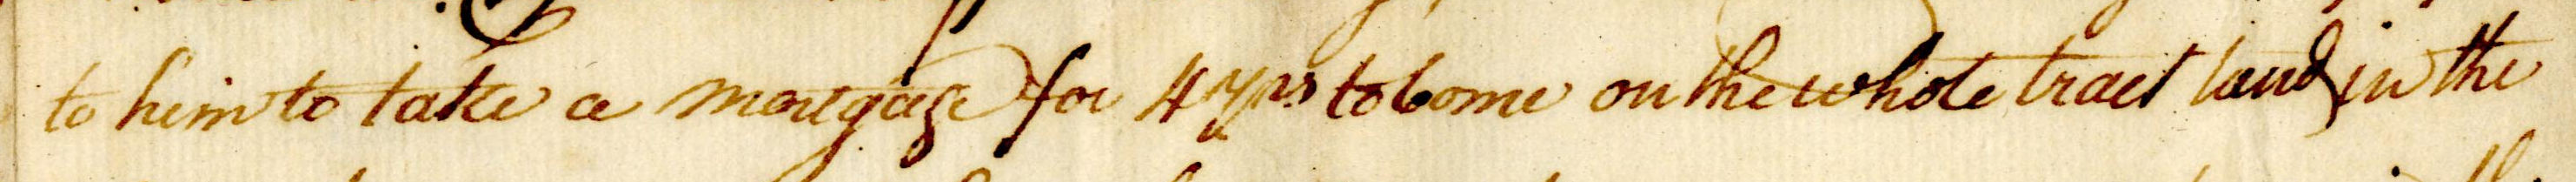to him to take a mortgage for 4 y^rs to Come on the whole tract land in the
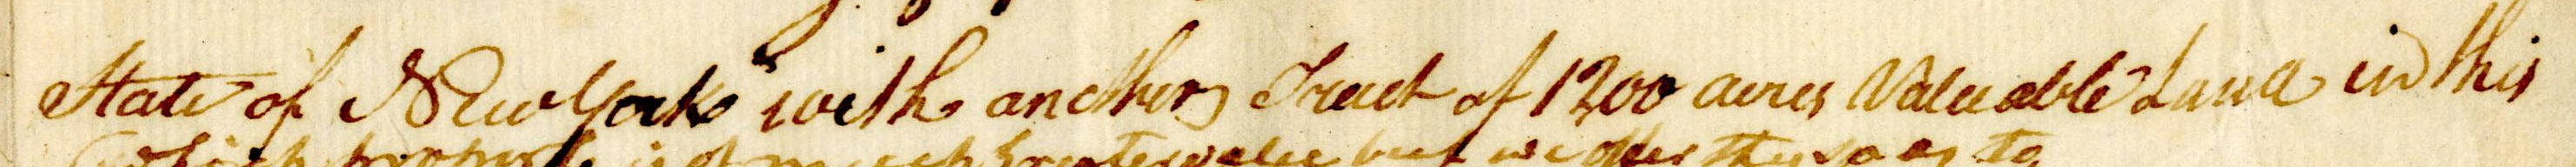State of New Yorks with another tract of 1200 acres Valuable Land in this
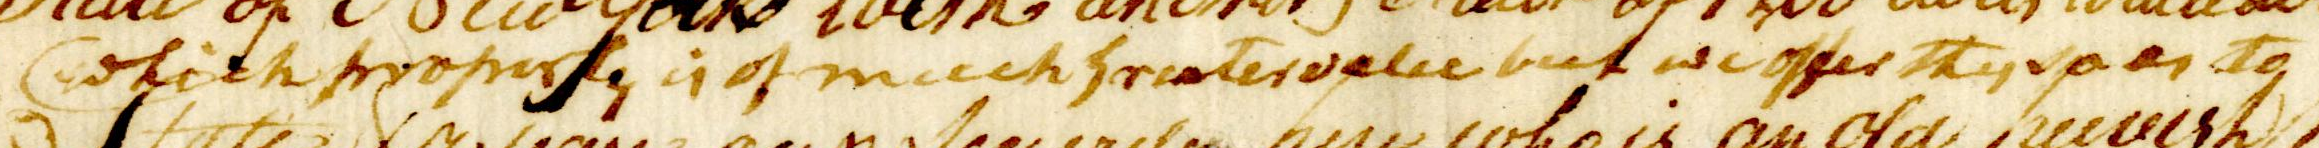(which property is of much Greater value but we offer thy you to
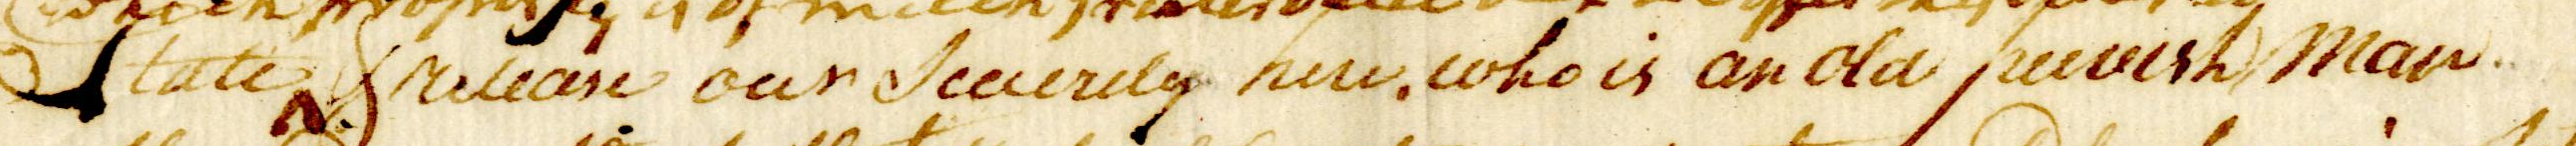State & release our security here, who is an old peevish Man
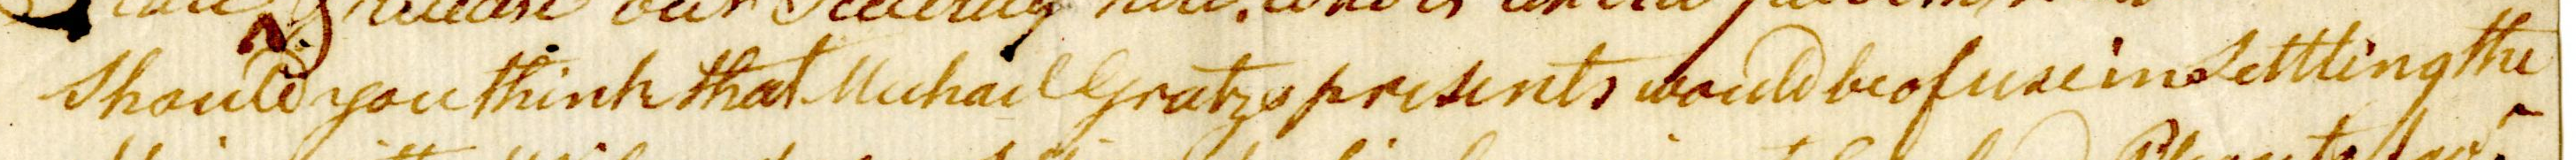should you think that Michael Gratzs presents would be of use in Settling the
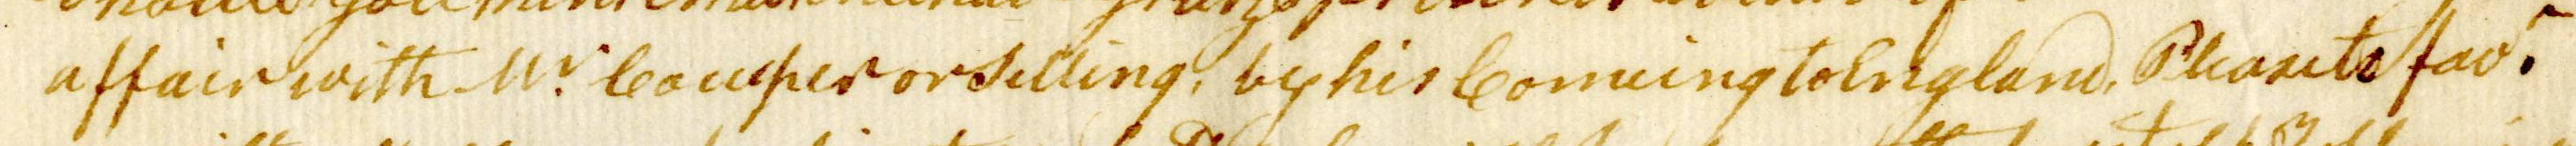affair with M^r. Couper or Setling by his Coming to England Please to fav^r
